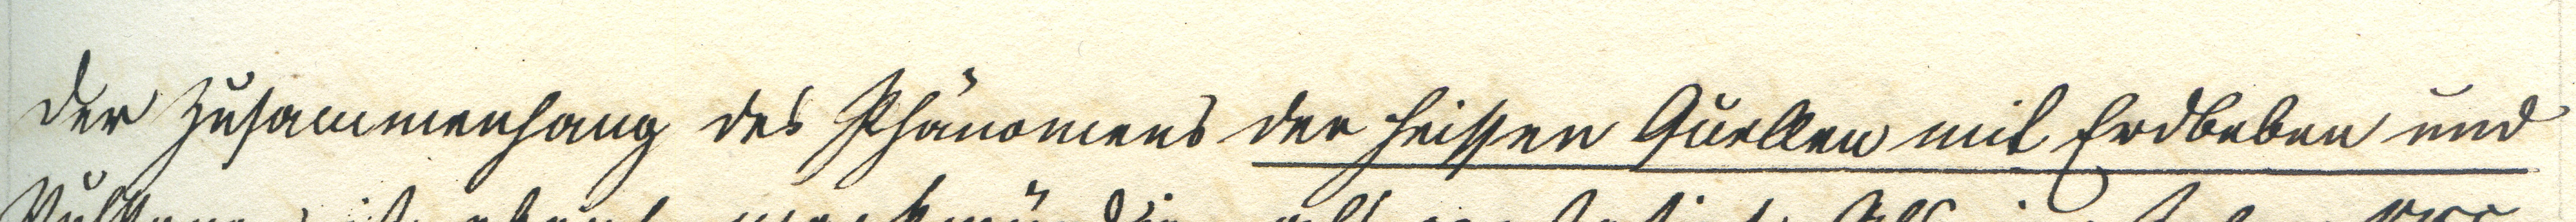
Der Zusammenhang des Phänomens der heissen Quellen mit Erdbeben und
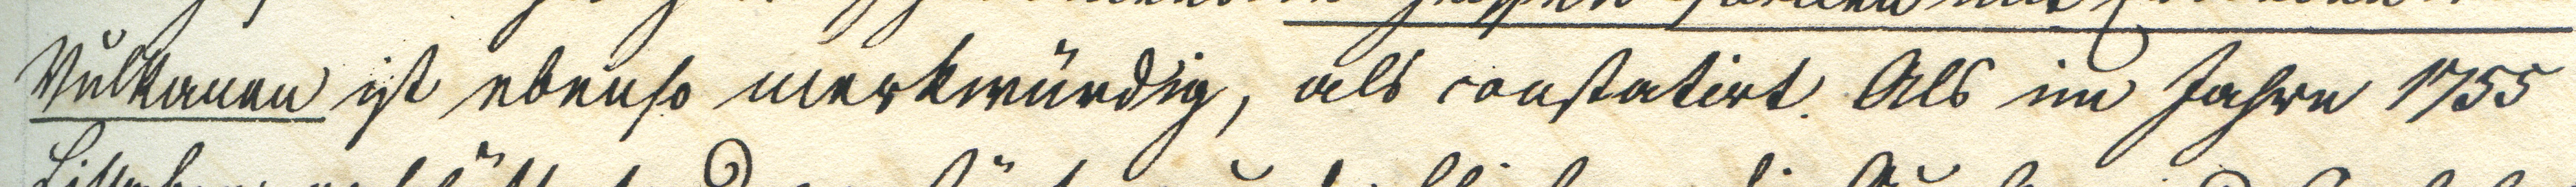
Vulkanen ist ebenso merkwürdig, als constatirt. Als im Jahre 1755
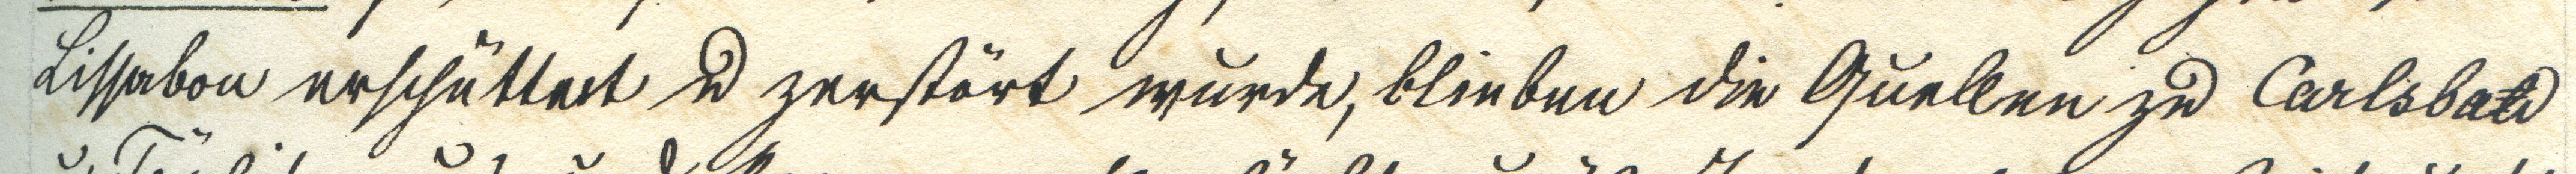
Lissabon erschüttert u zerstört wurde, blieben die Quellen zu Carlsbald
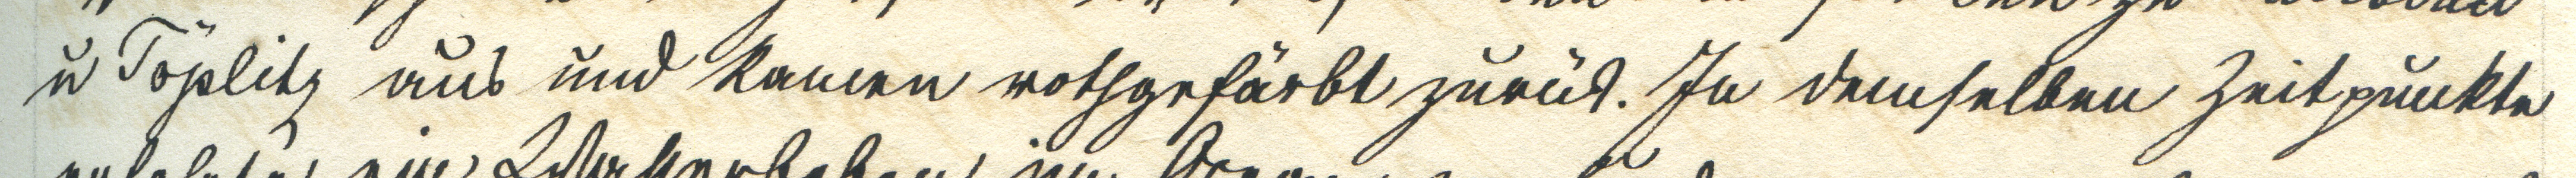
u Töplitz aus und kamen rothgefärbt zurück. In demselben Zeitpunkte
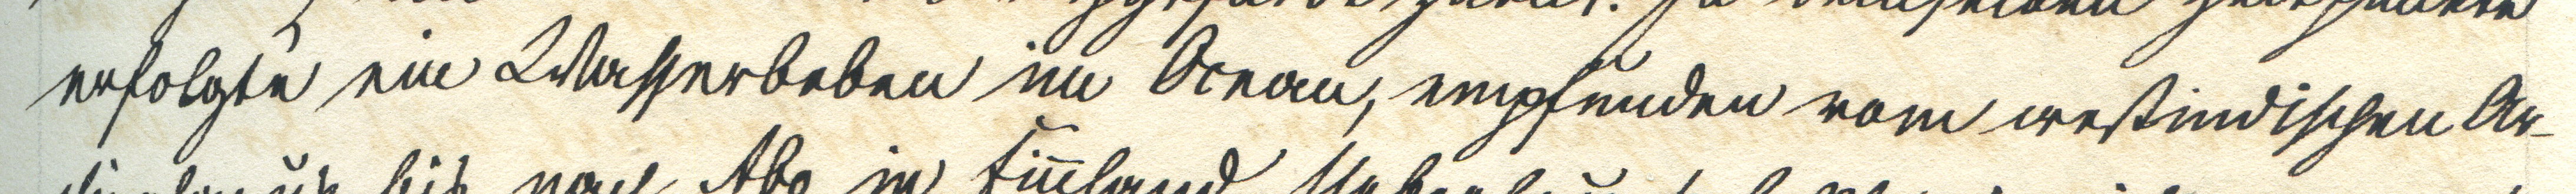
erfolgte ein Wasserbeben im Ocean, empfunden vom westindischen Ar-
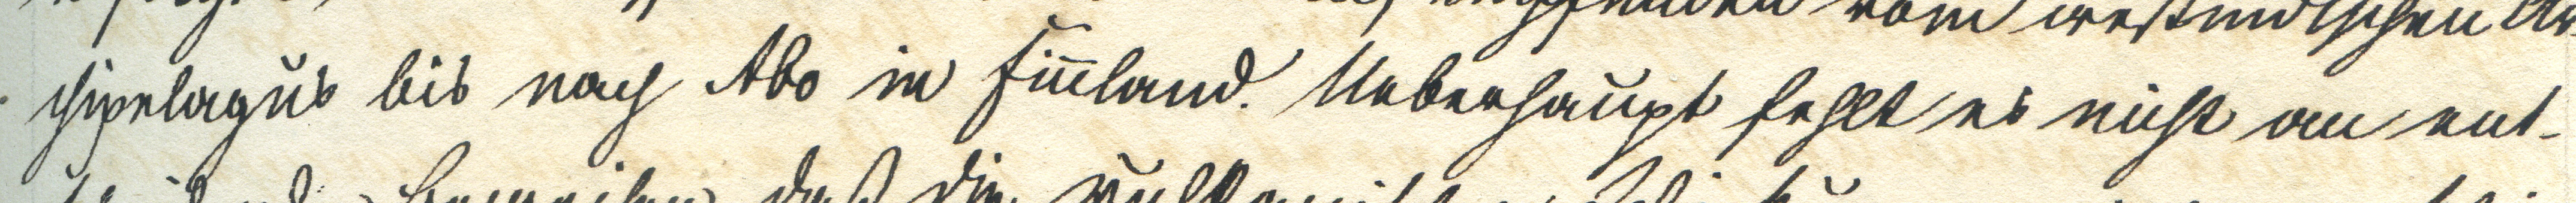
chipelagus bis nach Abo in Fiñland. Ueberhaupt fehlt es nicht an ent-
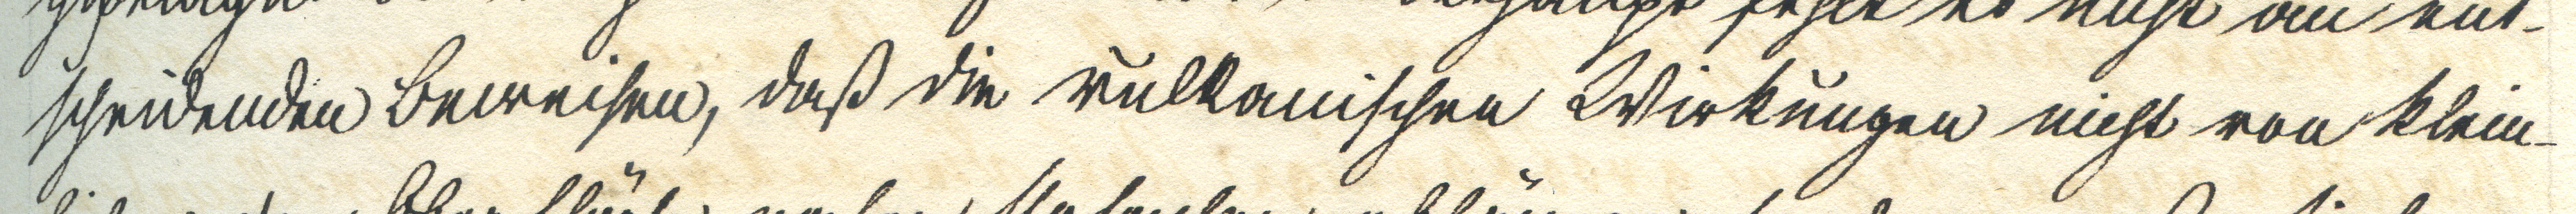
scheidenden Beweisen, daß die vulkanischen Wirkungen nicht von klein-
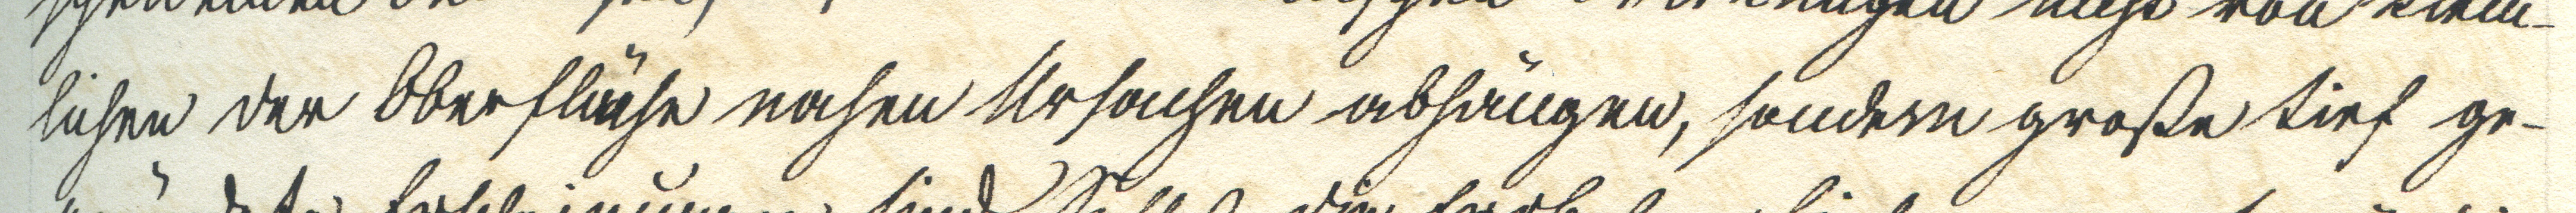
lichen der Oberfläche nahen Ursachen abhängen, sondern große, tief ge-
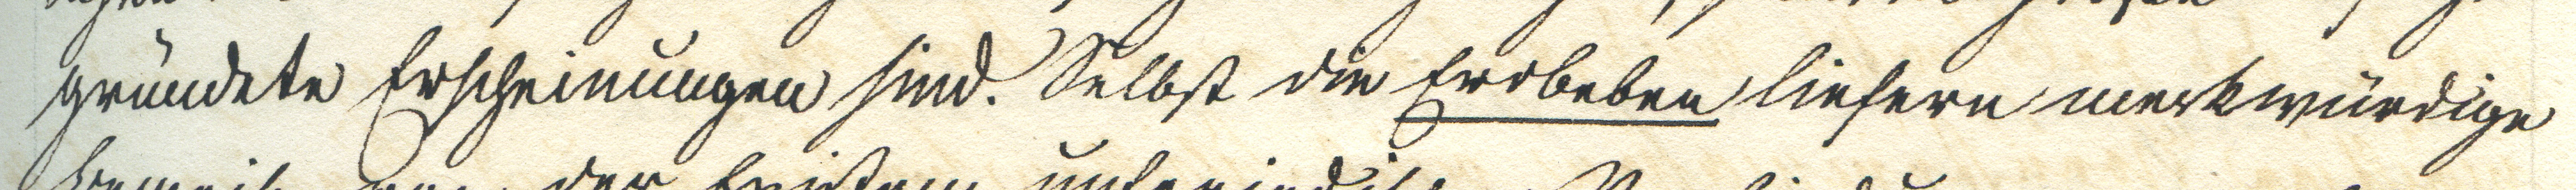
gründete Erscheinungen sind. Selbst die Erdbeben liefern merkwürdige
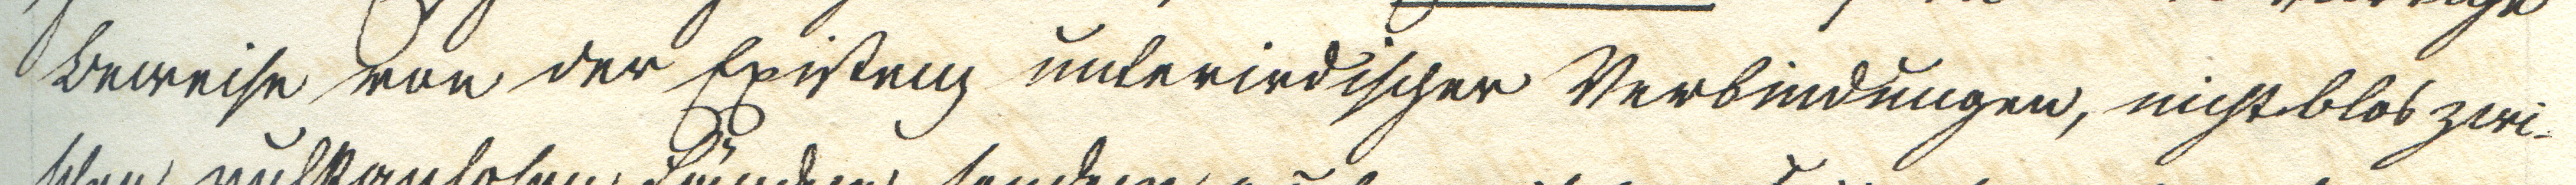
Beweise von der Existenz unterirdischer Verbindungen, nicht blos zwi-
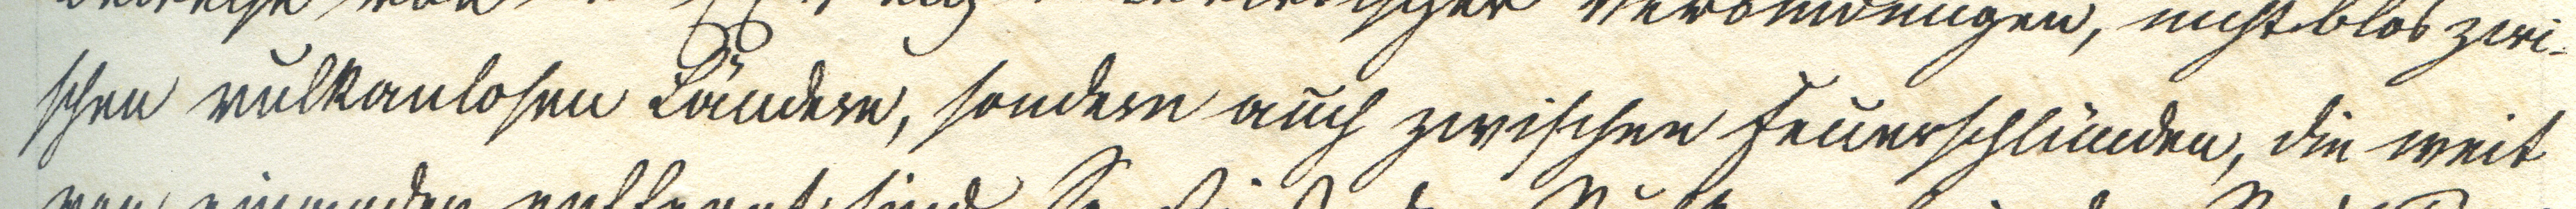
schen vulkanlosen Bändern, sondern auch zwischen Feuerschlünden, die weit
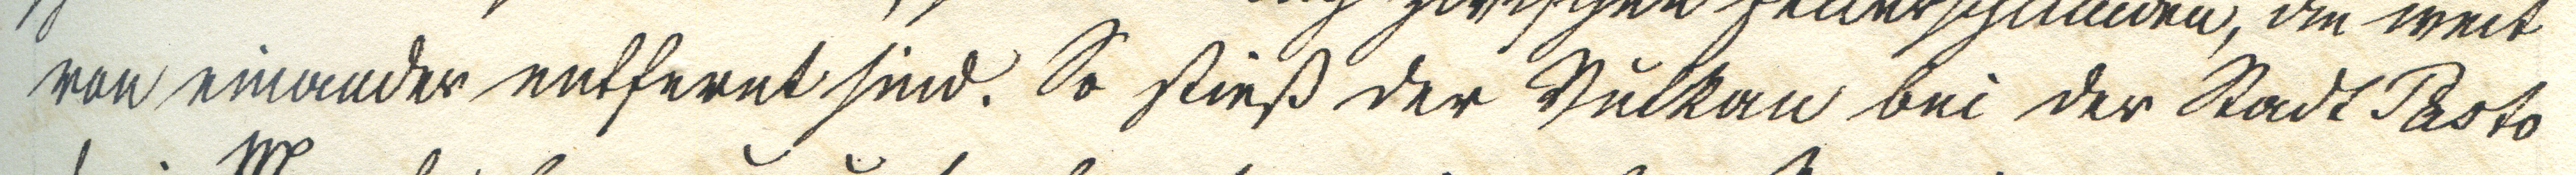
voneinander entfernt sind. So stieß der Vulkan bei der Stadt Pasto
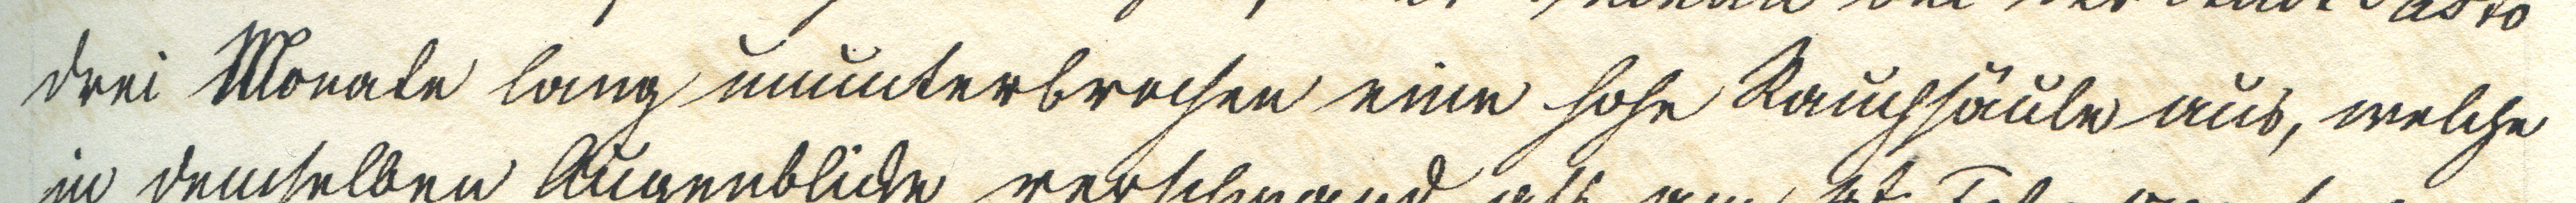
drei Monate lang ununterbrochen eine hohe Rauchsäule aus, welche
